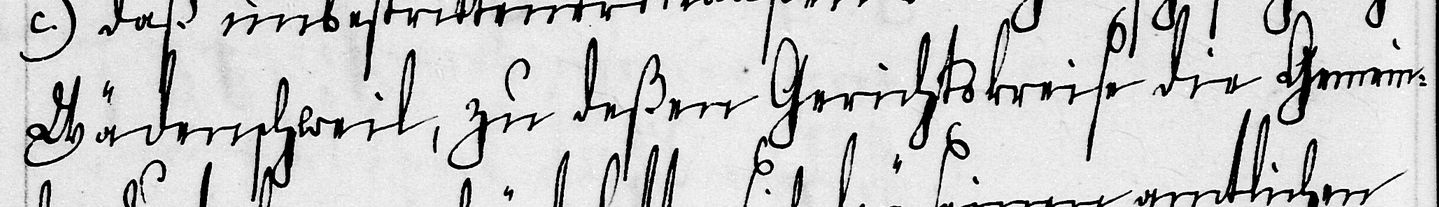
Wädenschweil, zu deßen Gerichtskreise die Gemein¬
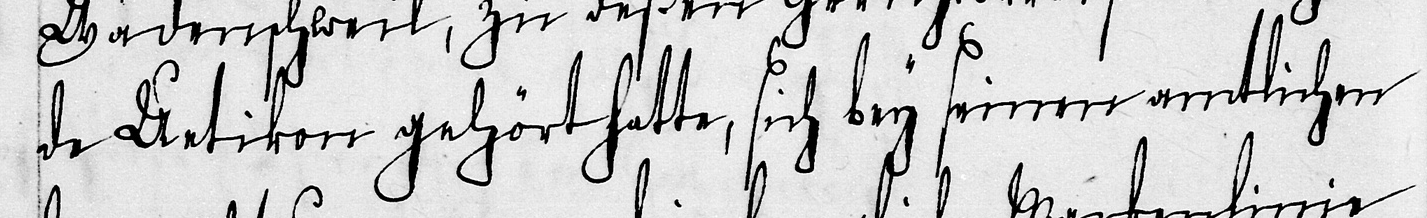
de Uetikon gehört hatte, sich bey seinen amtlichen
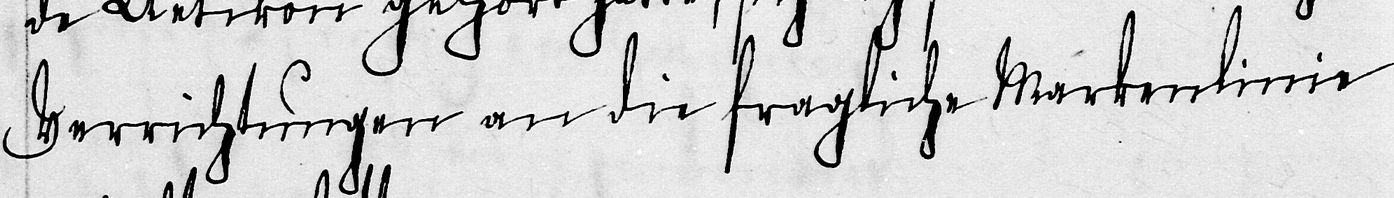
Verrichtungen an die fragliche Markenlinie
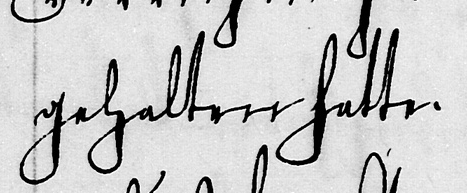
gehalten hatte.
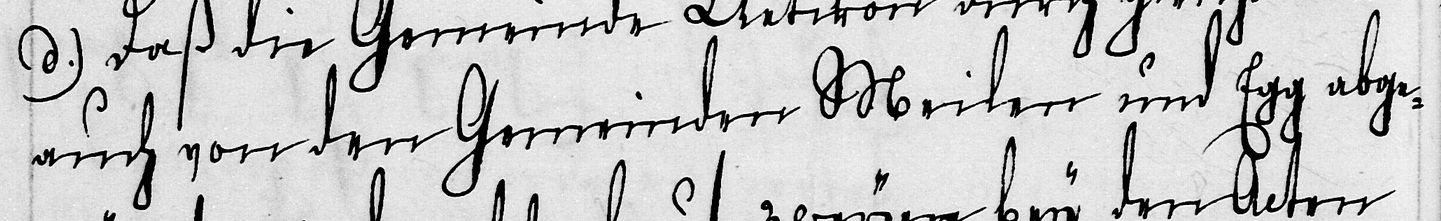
auch von den Gemeinden Meilen und Egg abge¬
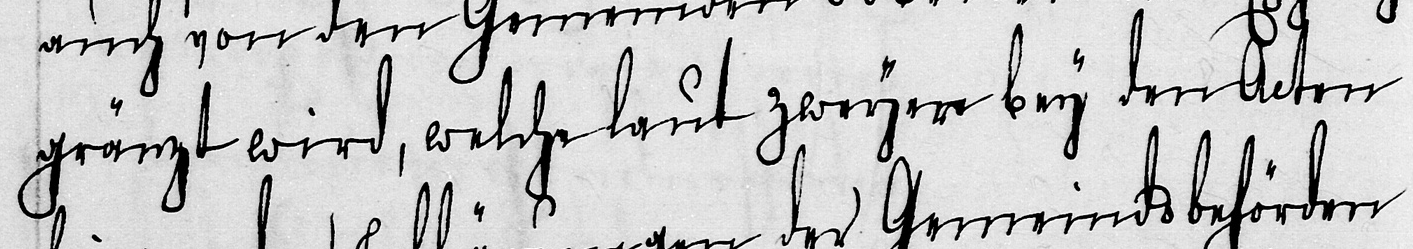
gränzt wird, welche laut zweyer bey den Acten
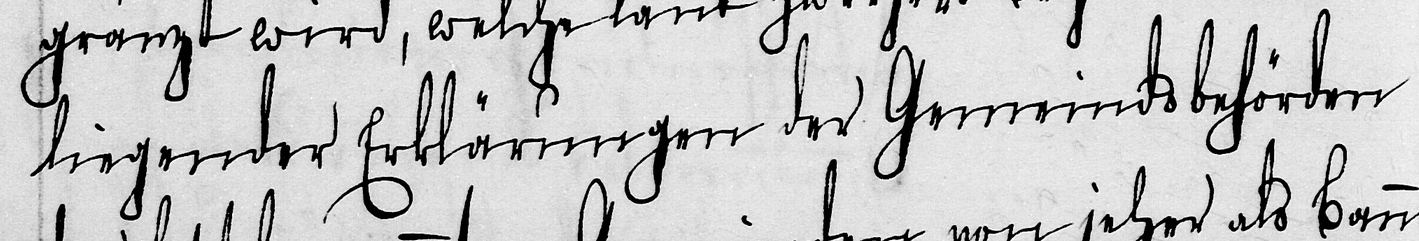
liegender Erklärungen der Gemeindsbehörden
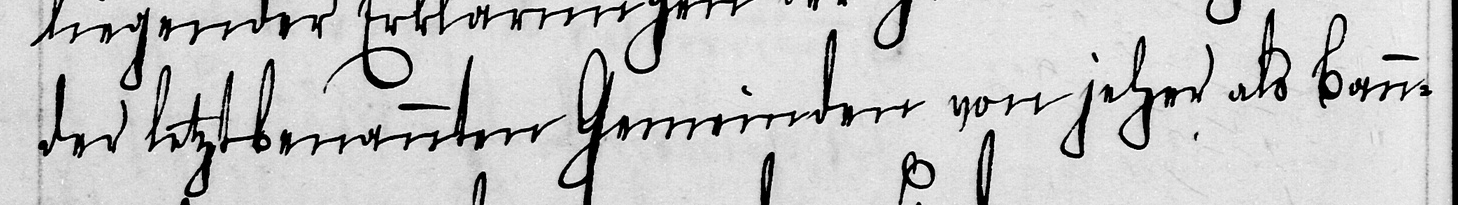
der letztbenannten Gemeinden von jeher als Bann¬
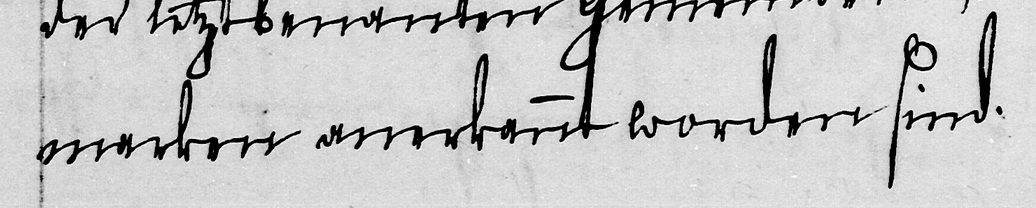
marken anerkannt worden sind.
